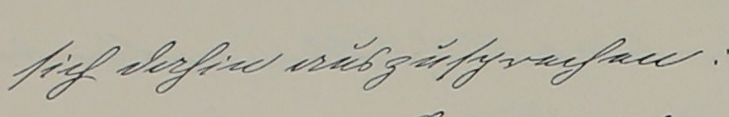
sich dahin auszusprechen:
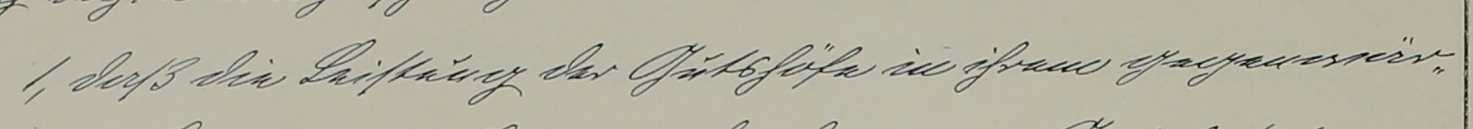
1. daß die Leistung der Gutshöfe in ihrem gegenwär-
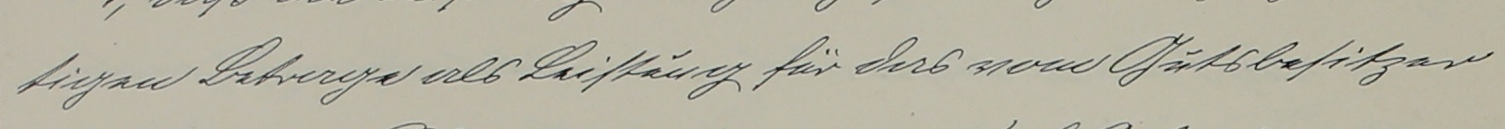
tigen Betrage als Leistung für das vom Gutsbesitzer
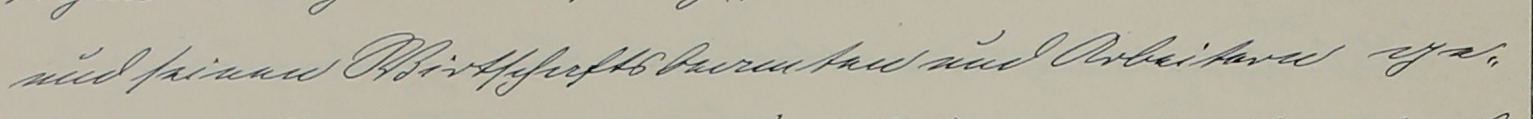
und seinen Wirtschaftsbeamten und Arbeitern ge-
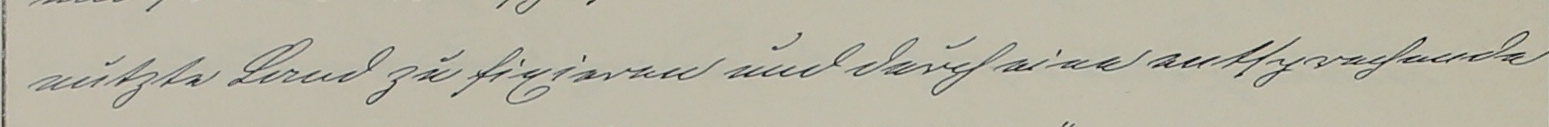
nutzte Land zu fixieren und durch eine entsprechende
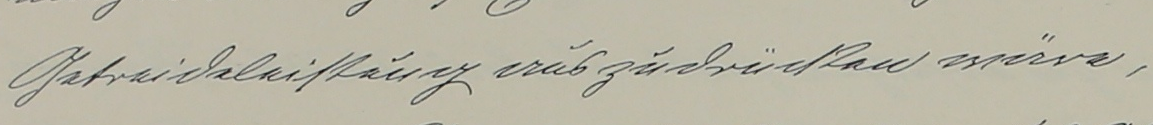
Getreideleistung auszudrücken wäre,
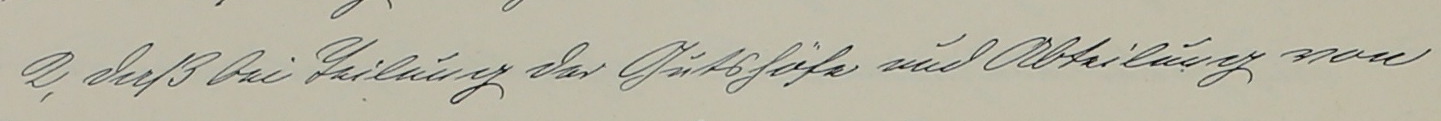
2. daß bei Teilung der Gutshöfe und Abteilung von
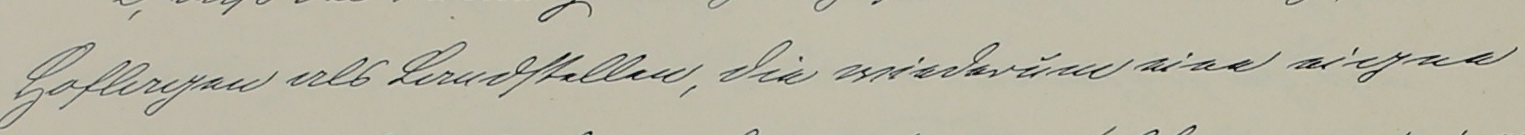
Hoflagen als Landstellen, die wiederum eine eigene
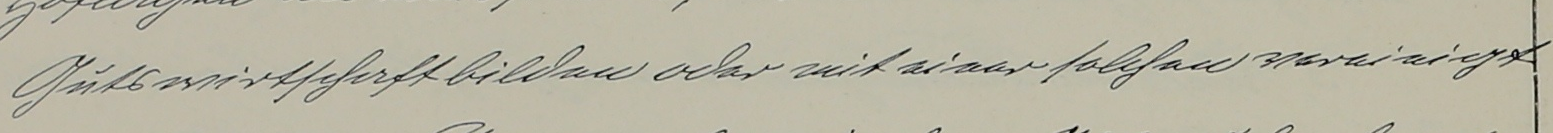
Gutswirtschaft bilden oder mit einer solchen vereinigt
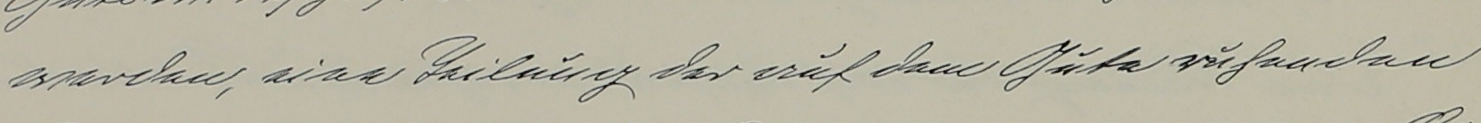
werden, eine Teilung der auf dem Gute ruhenden
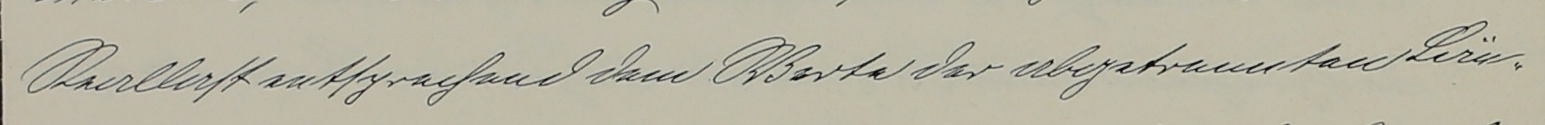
Reallast entsprechend dem Werte der abgetrennten Län-
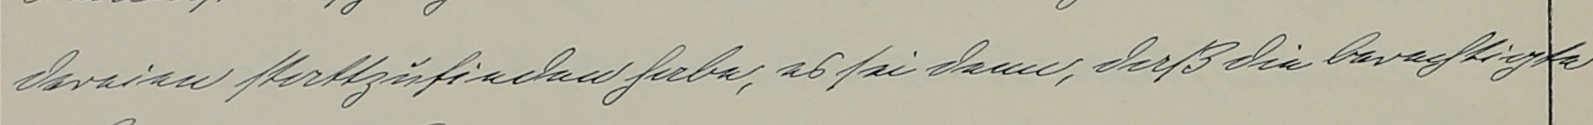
dereien stattzufinden habe, es sei denn, daß die berechtigte
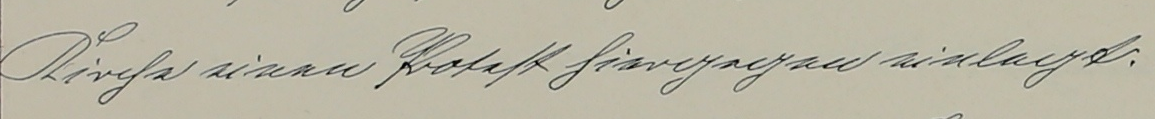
Kirche einen Protest hiergegen einlegt.
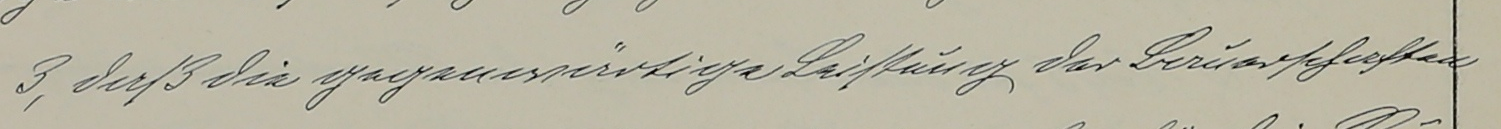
3. daß die gegenwärtige Leistung der Bauerschaften
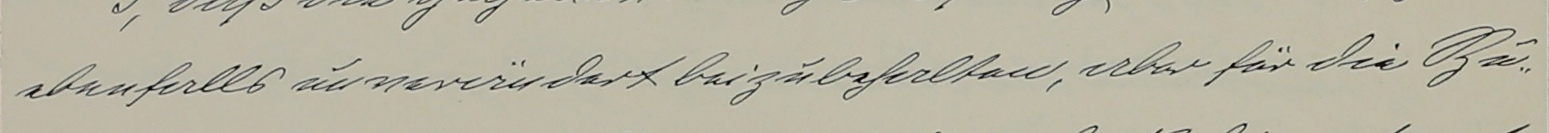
ebenfalls unverändert beizubehalten, aber für die Zu-
